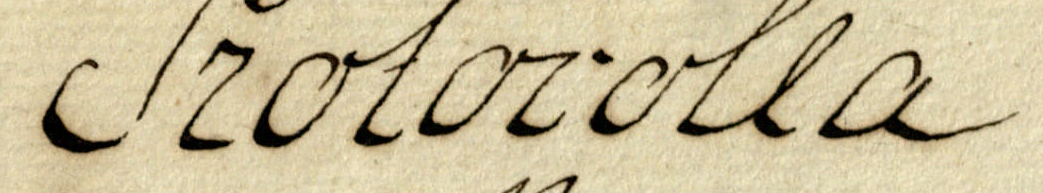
Protocolla
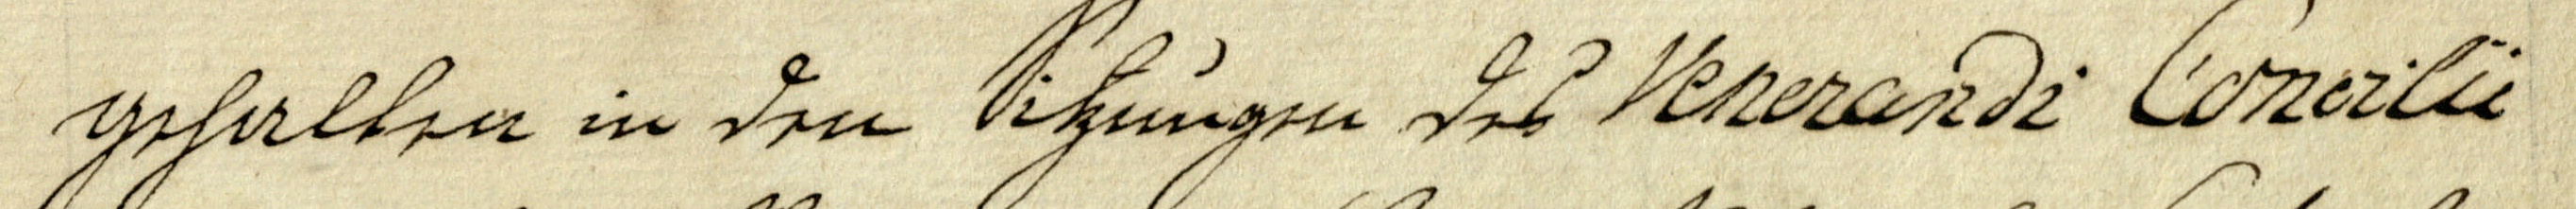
gehalten in den Sitzungen des Venerandi Concilii
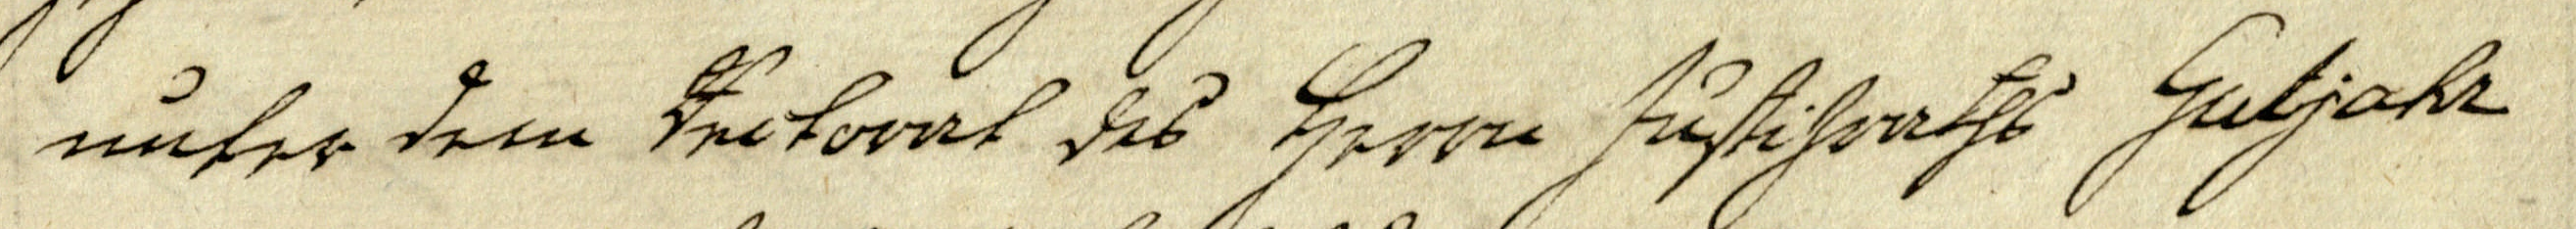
unter dem Rectorat des Herrn Justizraths Gutjahr
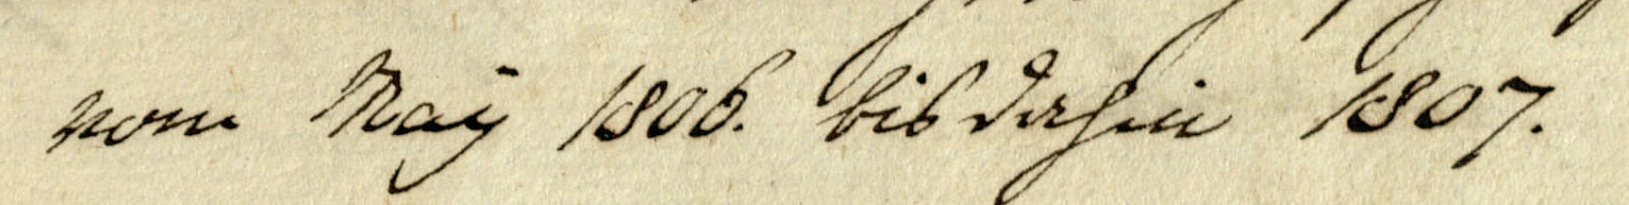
vom Maÿ 1806. bis dahin 1807.
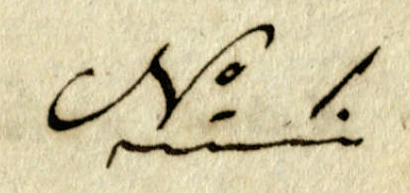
Nº 1.
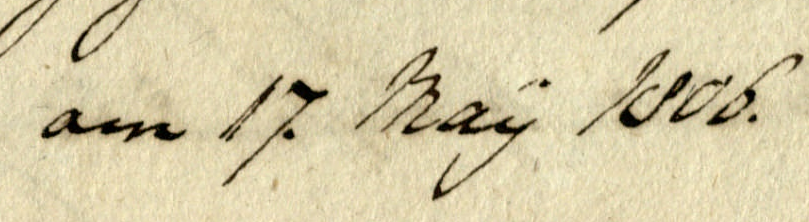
am 17. Maÿ 1806.
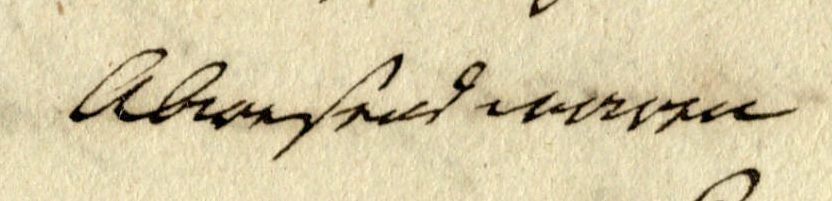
Abwesend waren
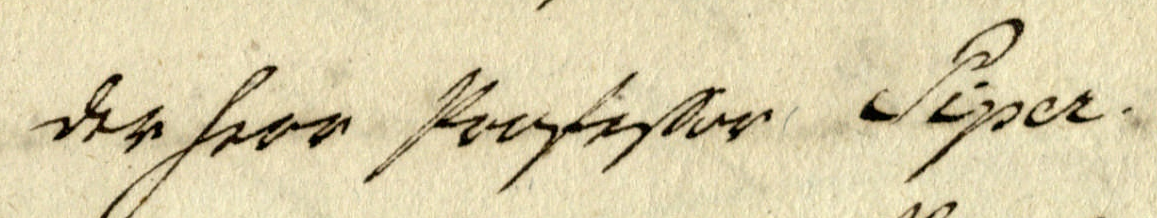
der herr Professor Piper.
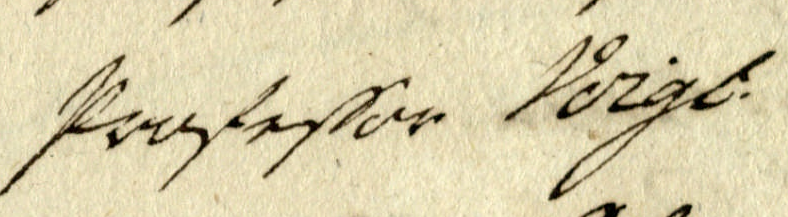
Professor Voigt.
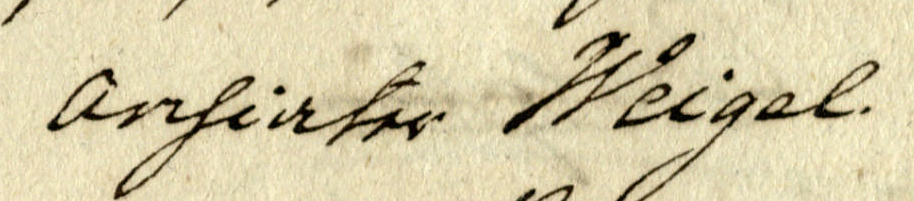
Archiater Weigel.
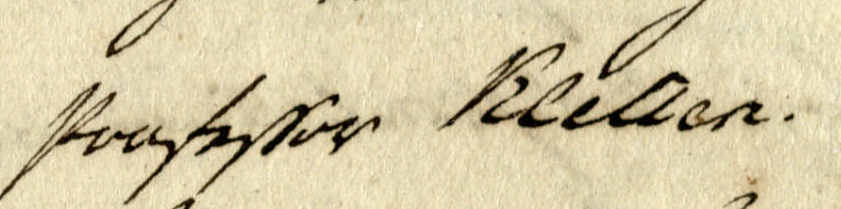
Professor Kletten.
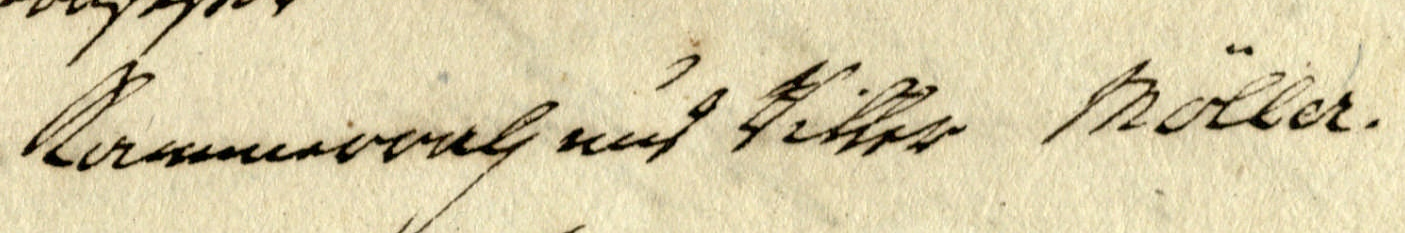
Kammerrath und Ritter Möller.
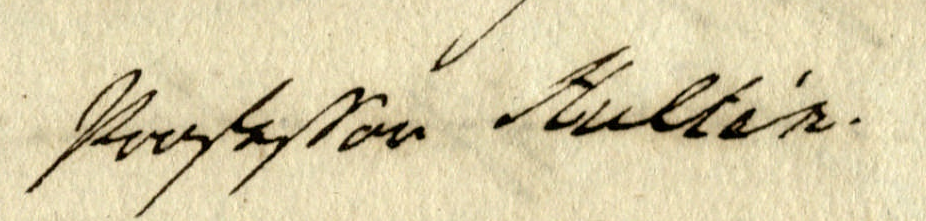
Professor Hultèn.
